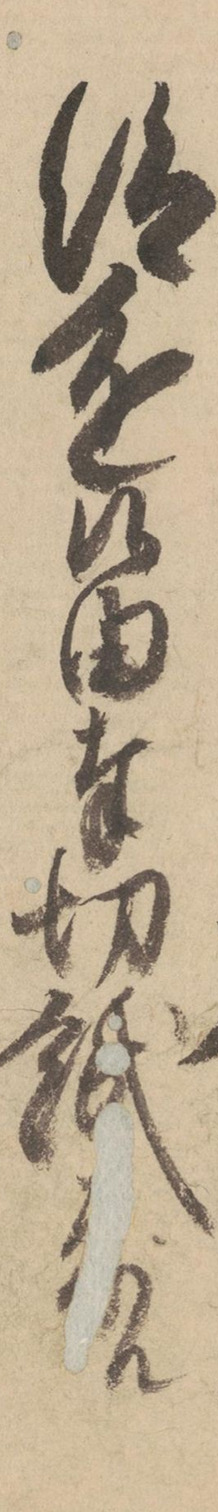仰進候由奉切紙来ㇽ
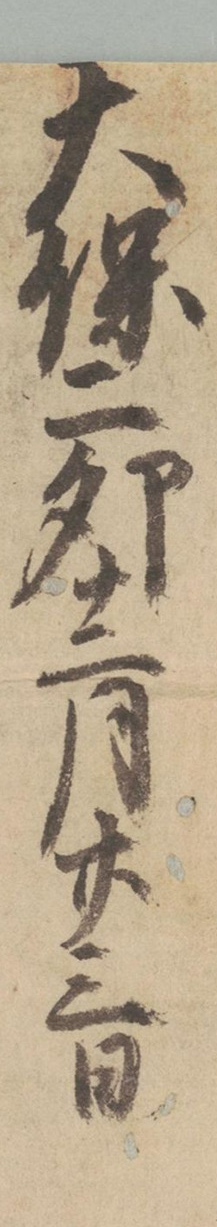天保二卯十二月廿三日
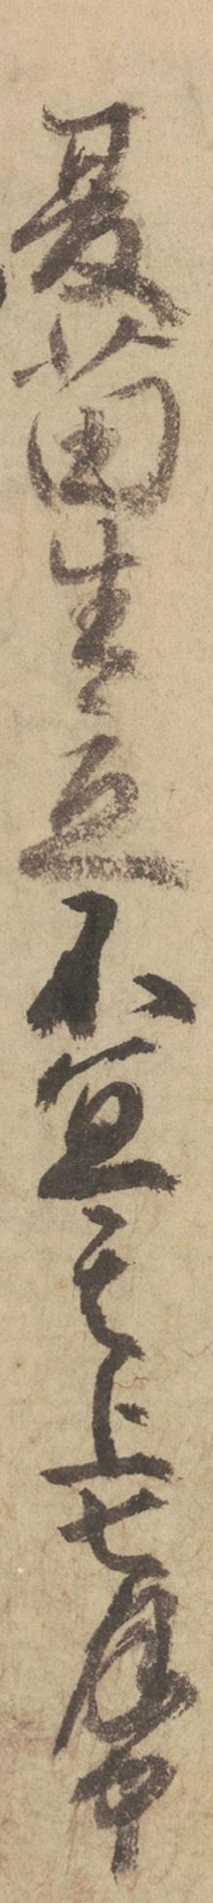夏苗生立不宜其上七月中
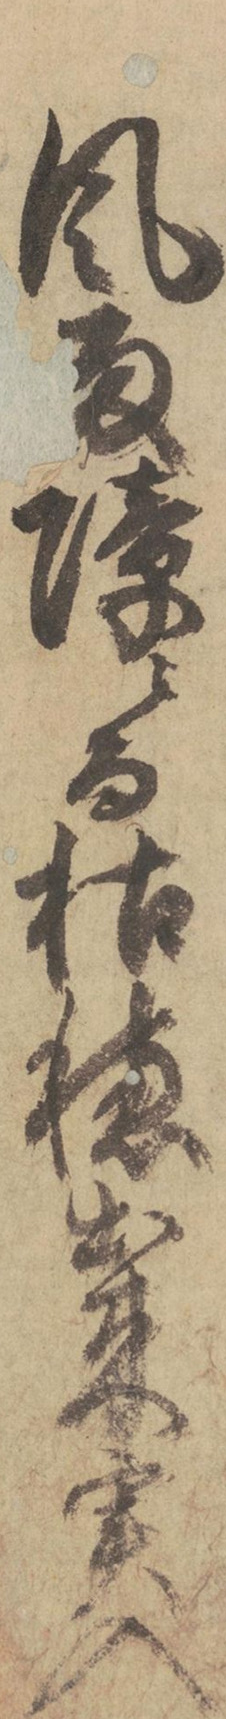風雨障二而枯穂出来実入
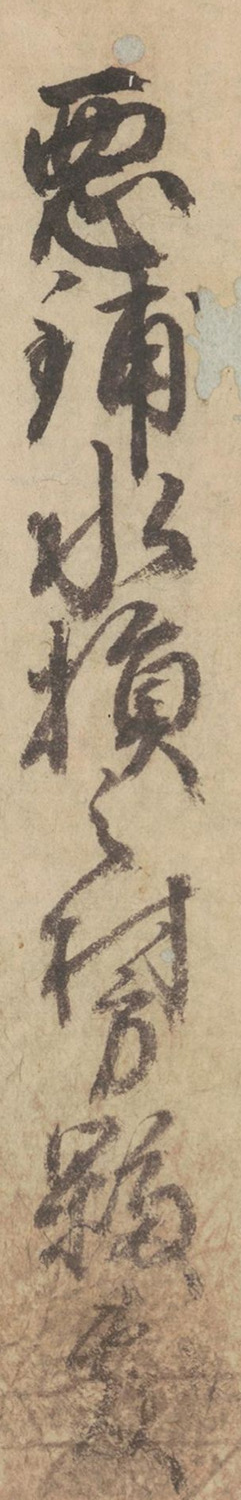悪鋪水損之村方夥敷
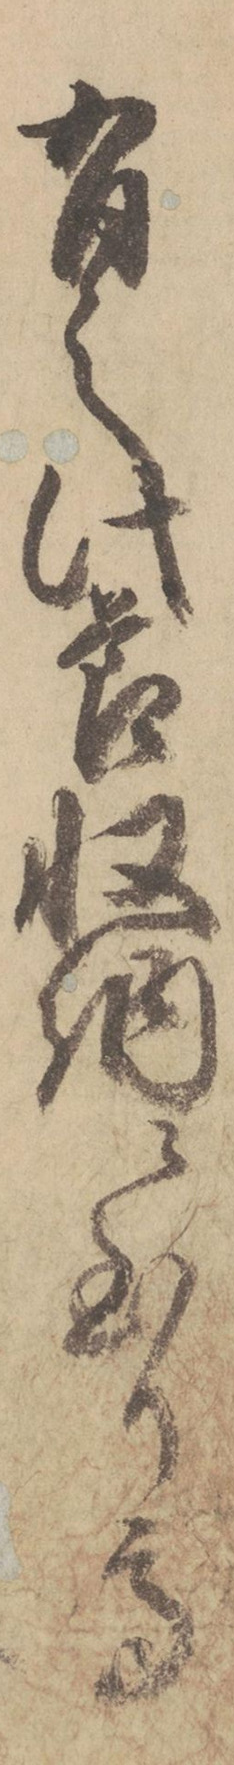有之此節収納二至り高
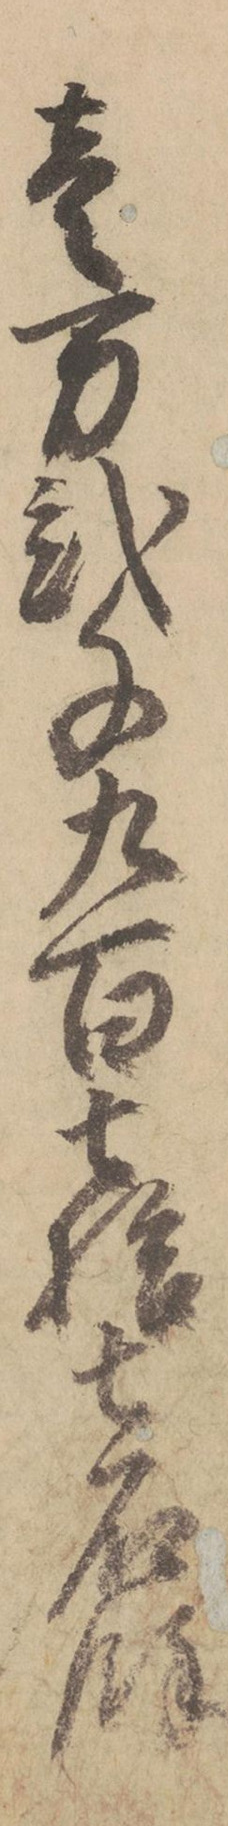壱万弐千九百七拾七石餘
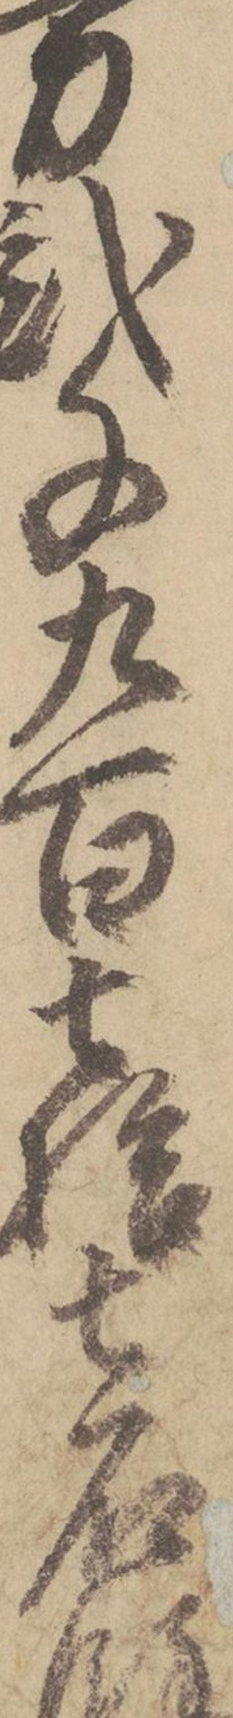壱万弐千九百七拾七石餘
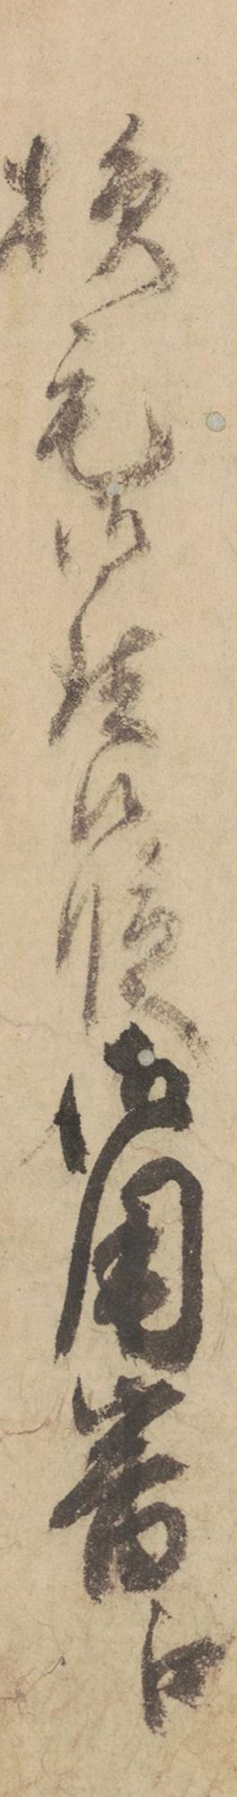損毛御座候段御用番江
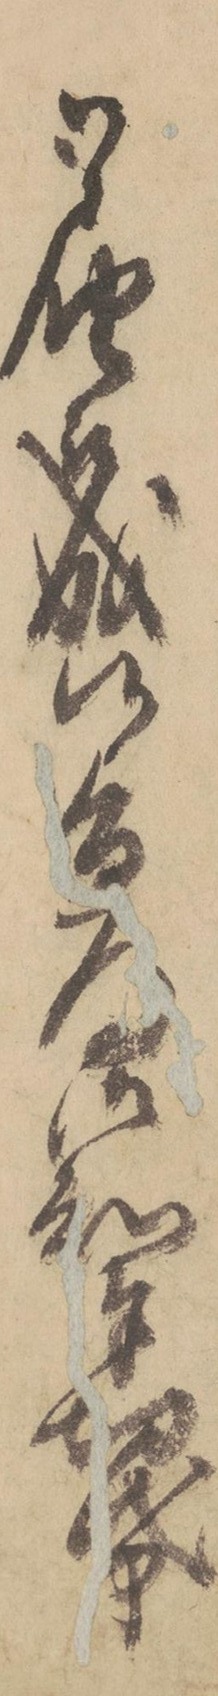御届被成候旨為御知奉切紙
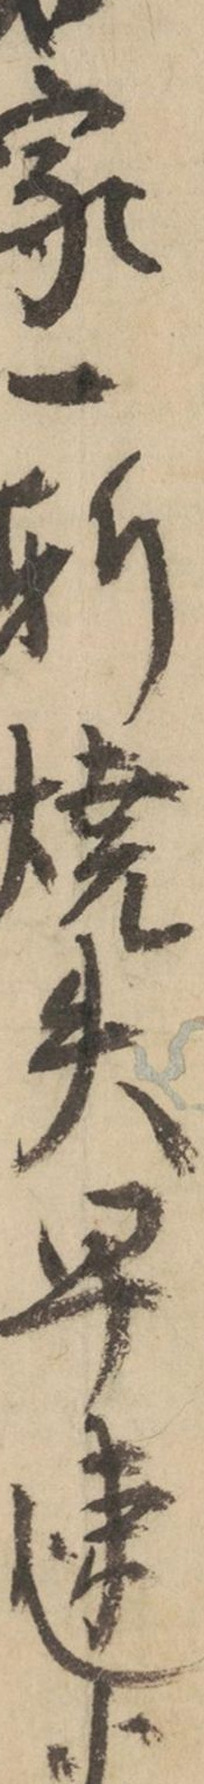右家一軒焼失早速火
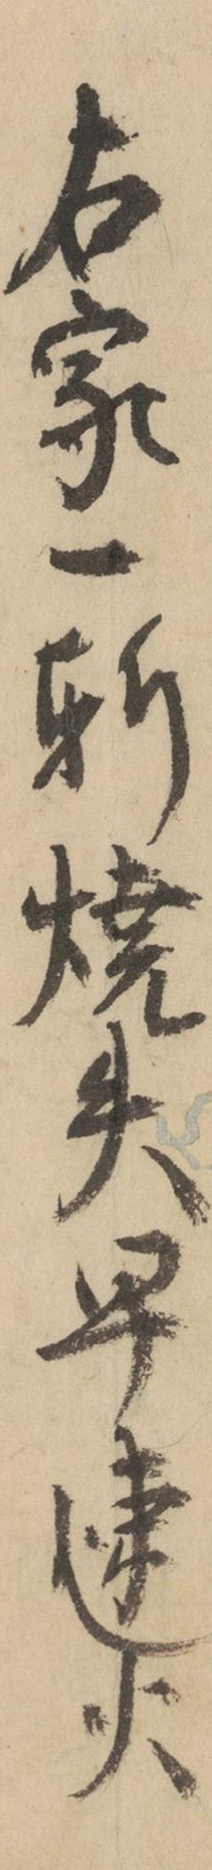右家一軒焼失早速火
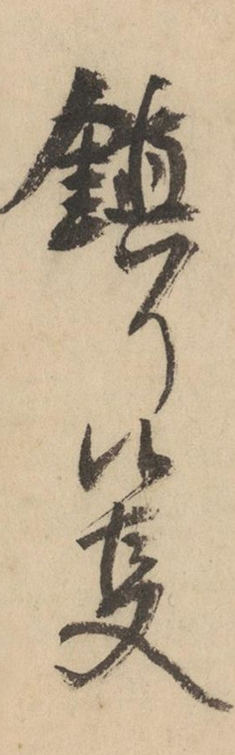鎮り候事
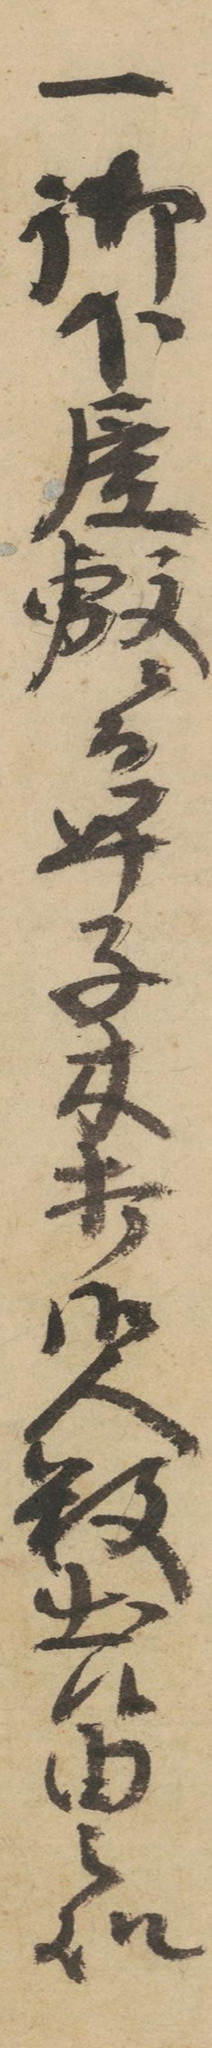一御下屋敷二而昇子木打御人数出候由之処
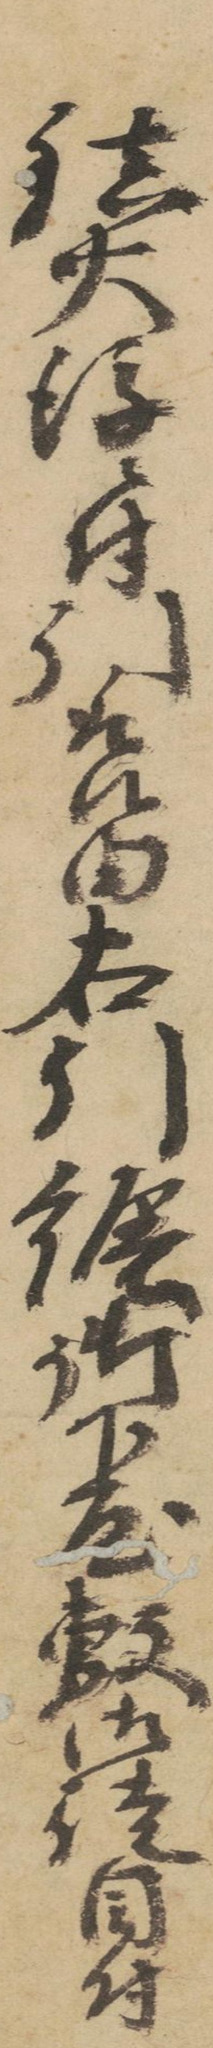鎮火後二付引取候由右引纏御下屋敷御徒目付
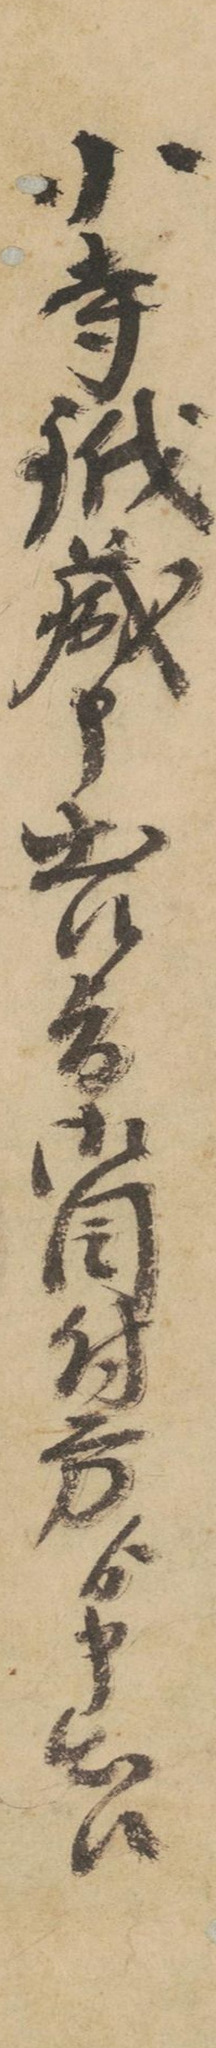小寺鋨蔵申出仰旨御目付方ゟ申出候
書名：[紀州藩災害記録]
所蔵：東京大学地震研究所図書室 Earthquake Research Institute Library, The University of Tokyo, JAPAN
